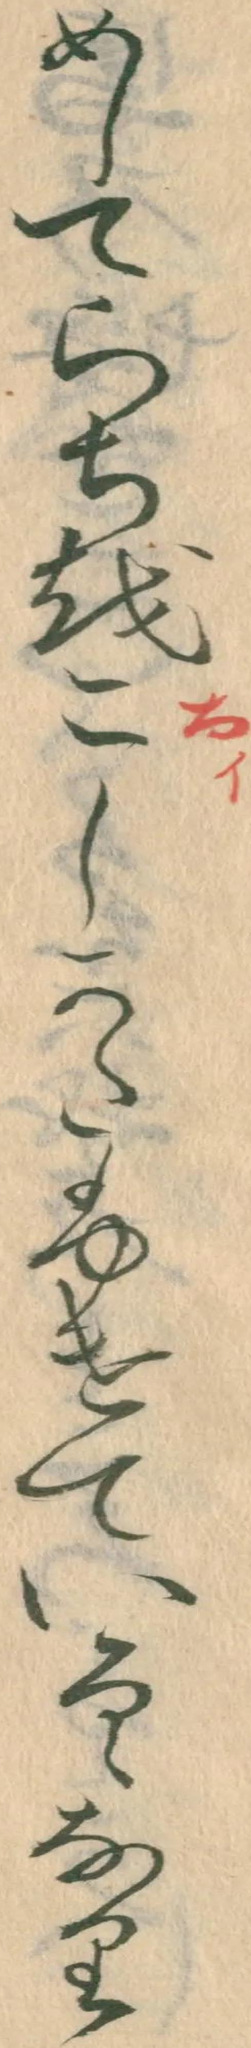めしてらちをこしかたふけているゝなり
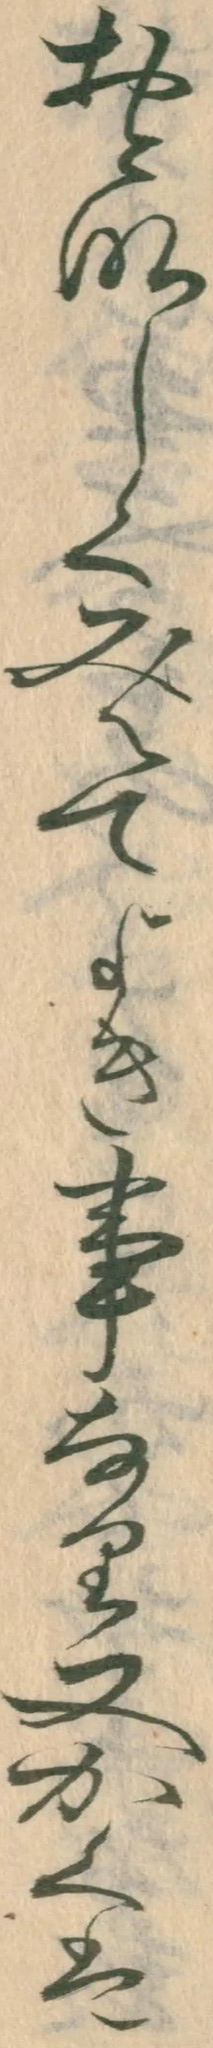おとなしく見えてよき事なり又かくは
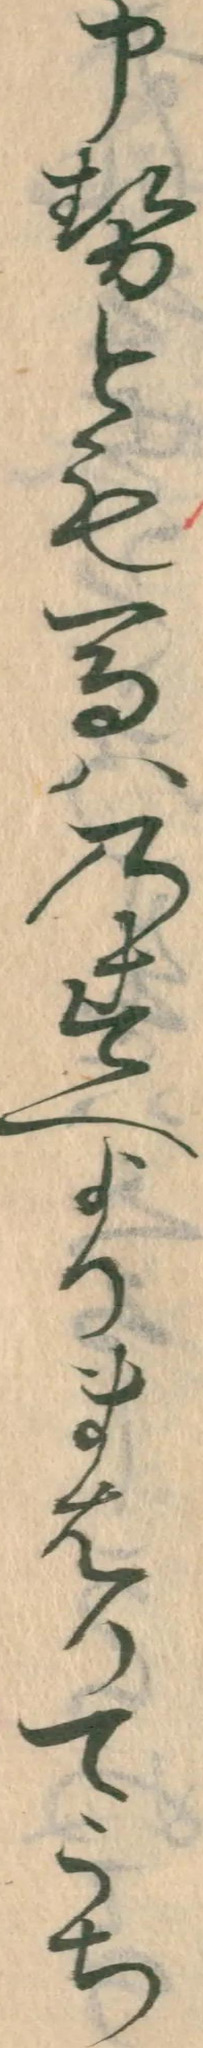申せとも馬はのすへよりまはりてうち
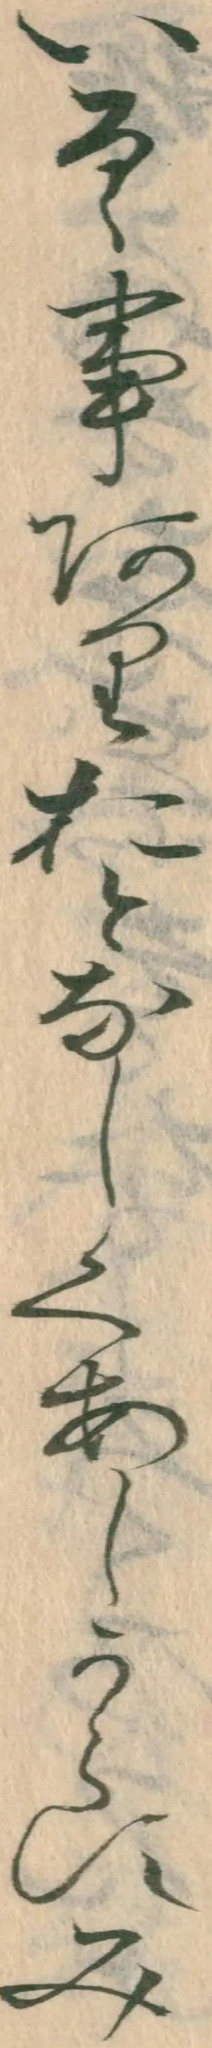いるゝ事ありおとなしくあしからすみ
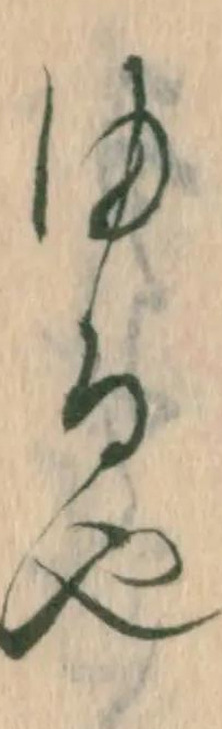ゆる也
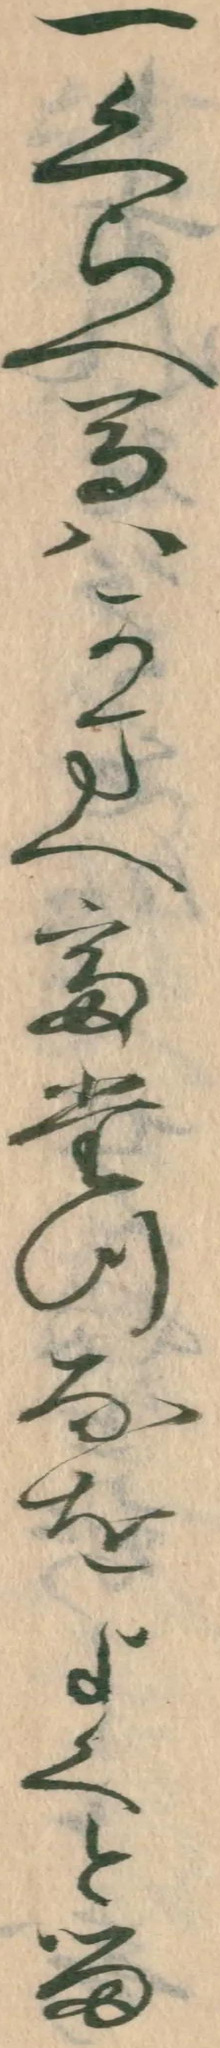一くらへ馬はかまへてたつなをよくと留
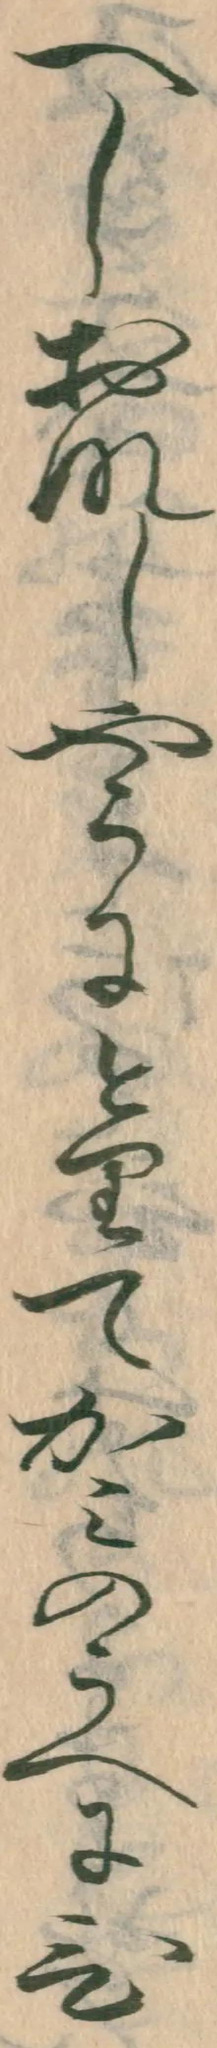へしおなしやうにとりてかみのうへにひ
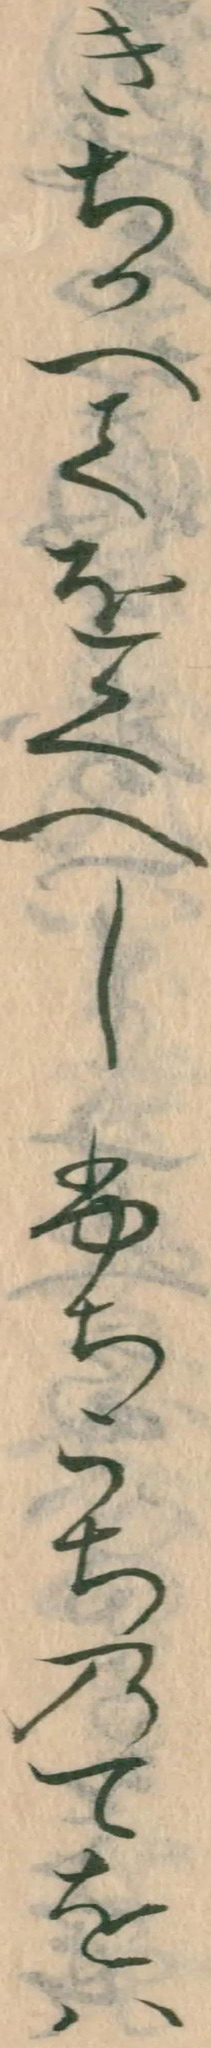きちかへてをくへしふちうちのてをは
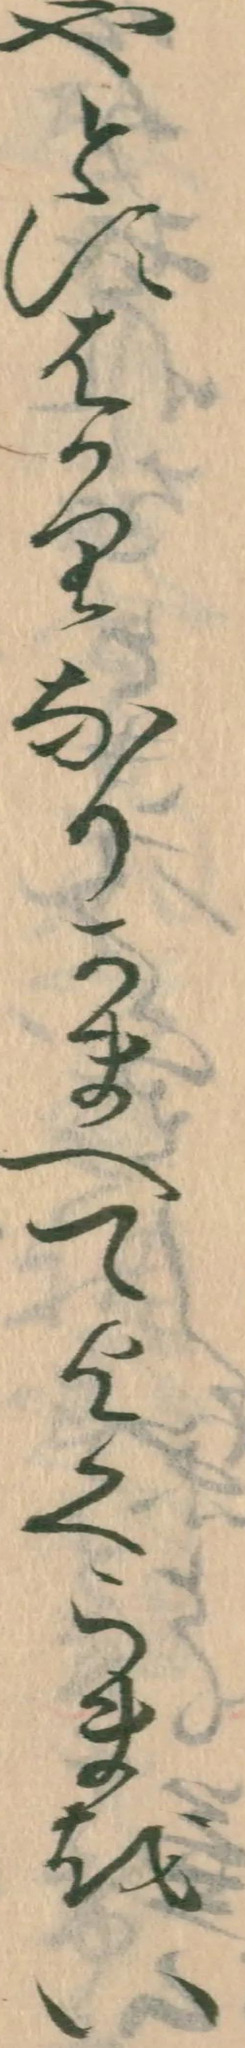やとすはかりなりかまへてよくこまをい
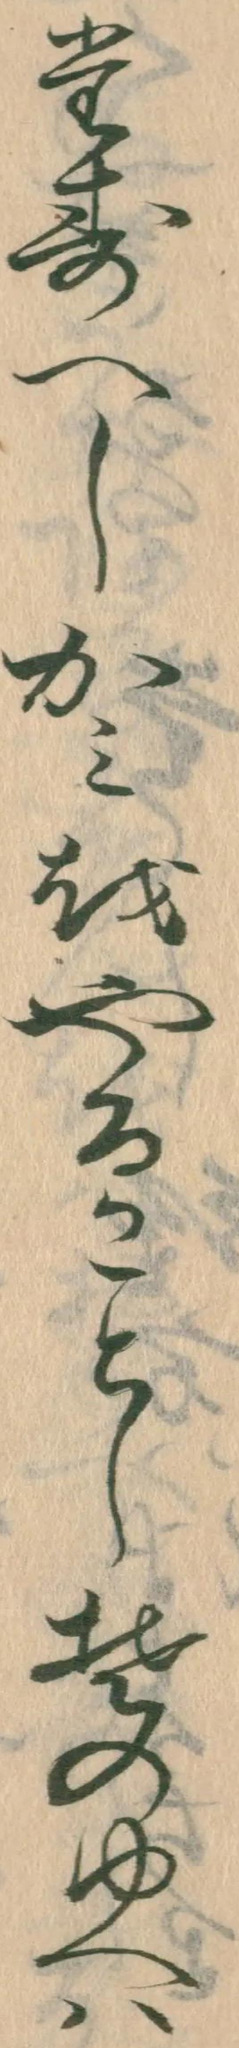たすへしかみをやるかことしそのゆへは
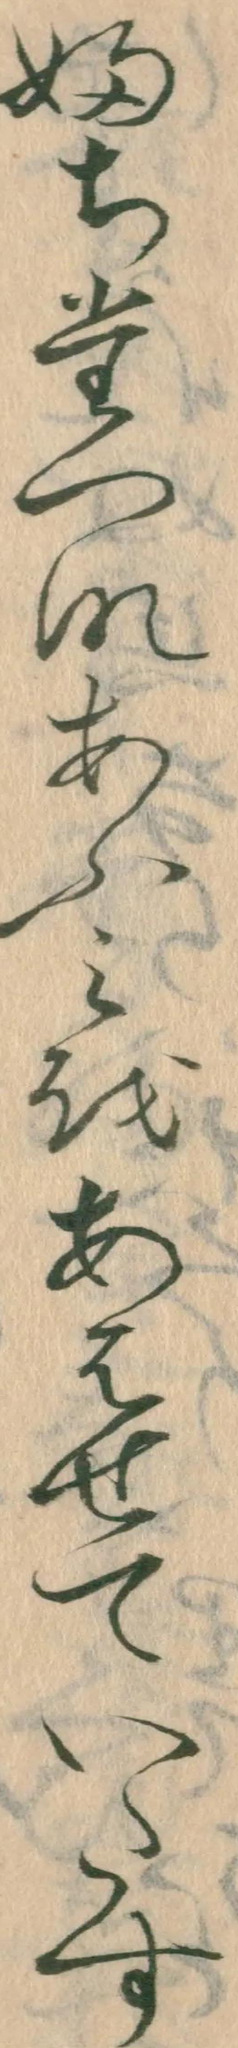ふちたつなあふみをあはせていたす
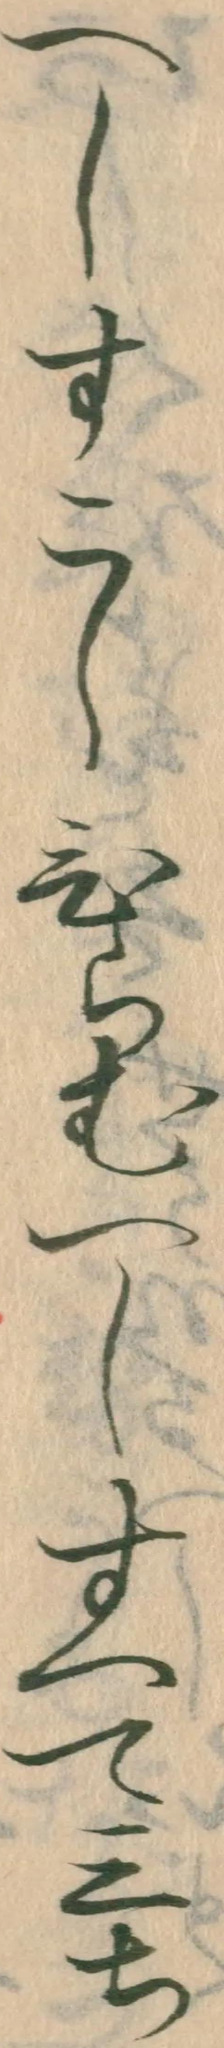へしすこしひらむへしすへて三ち
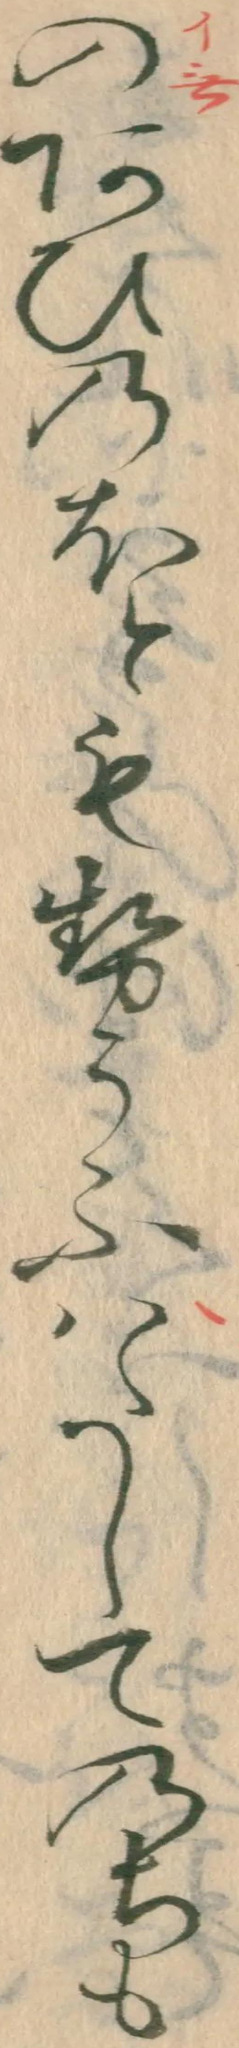のあひのほともせうふはたしてのちも
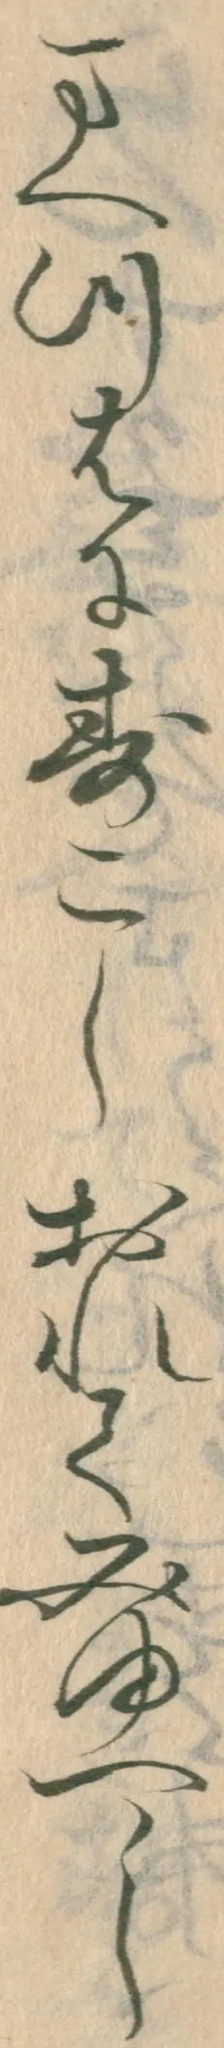まへつはにすこしおれてみゆへし
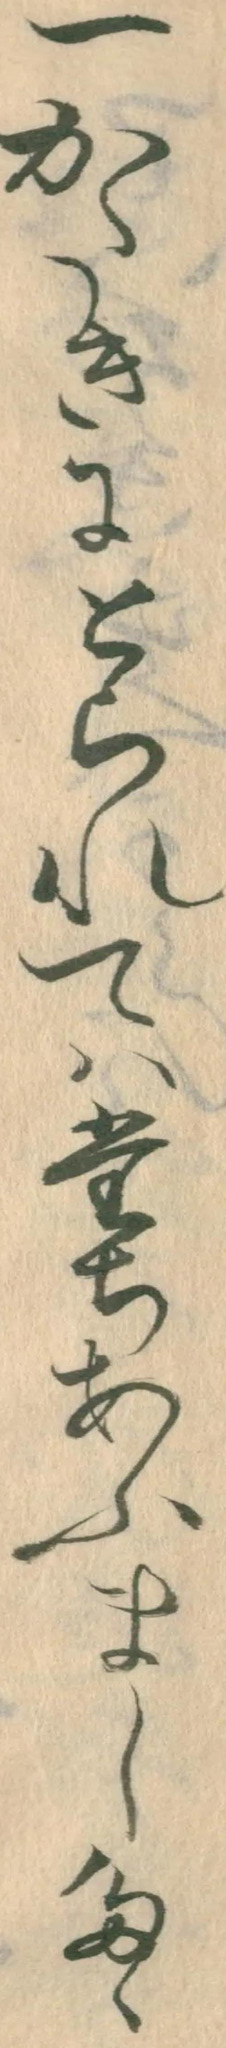一かたきにとられてはたちあふましたゝ
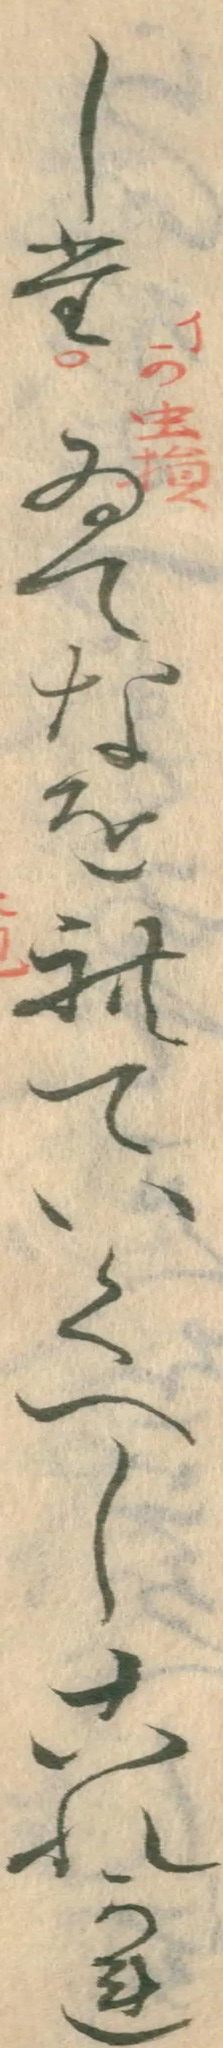した◦ゐてなをれていくへしこれかれ
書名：賀茂社記録. 第13冊
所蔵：国立国会図書館 National Diet Library, JAPAN
